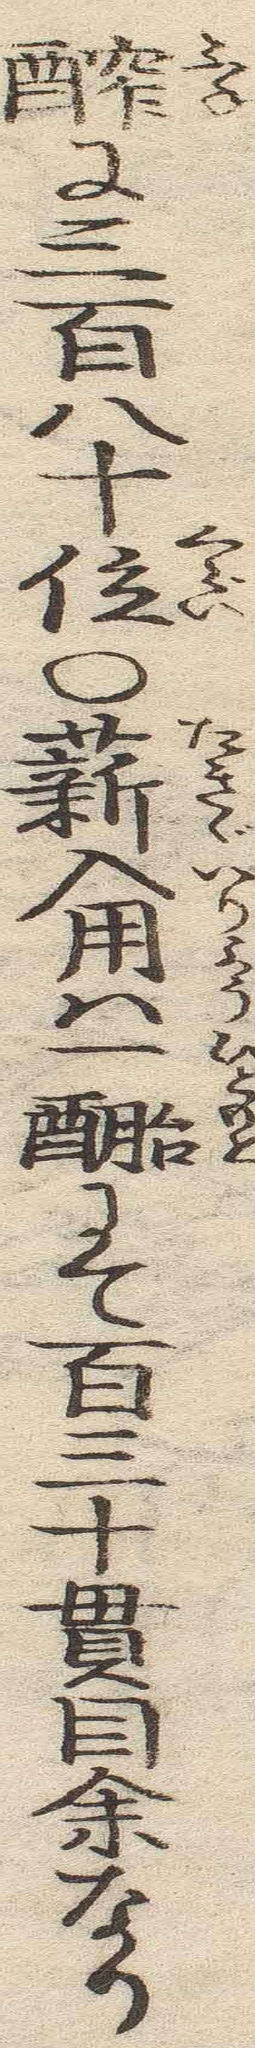醡に三百八十位○薪入用は一にて百三十貫目余なり
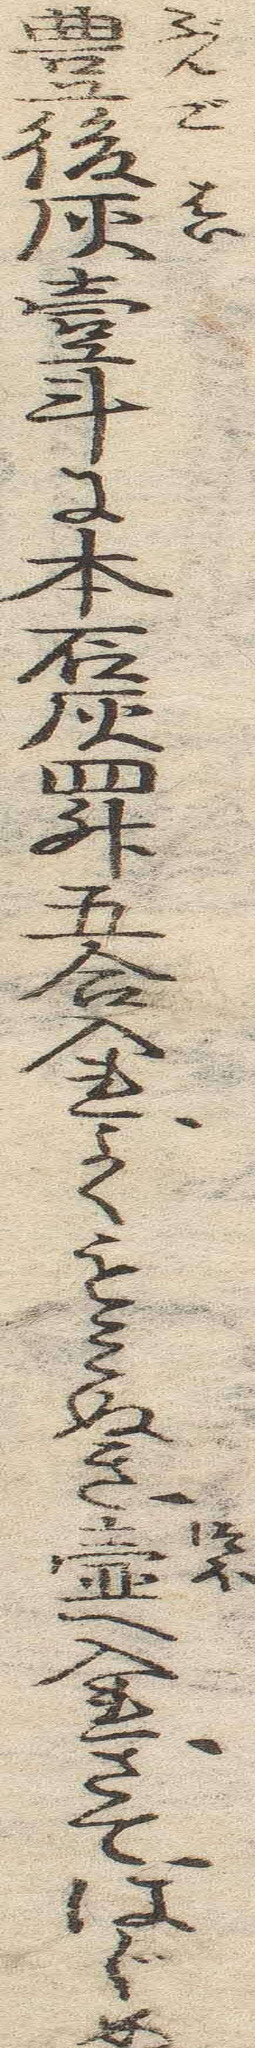豊後灰壱斗に本石灰四升五合入れ。よくもみぬき。壺へ入れ。さて。はじめ
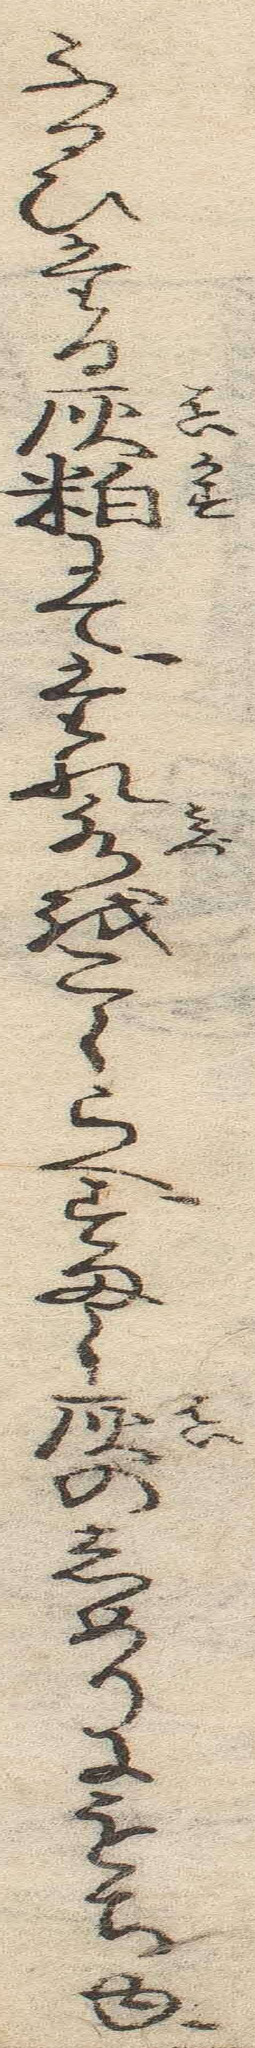ふるひたる灰粕にて。たれ水をこしらへ。すまし灰のしめりにもちゆ。
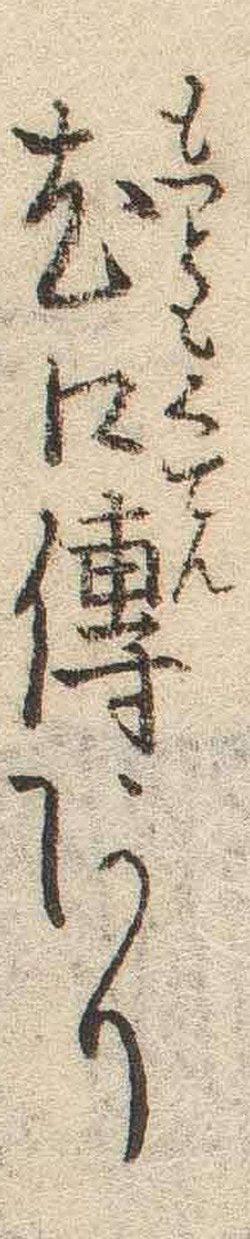尤口伝あり
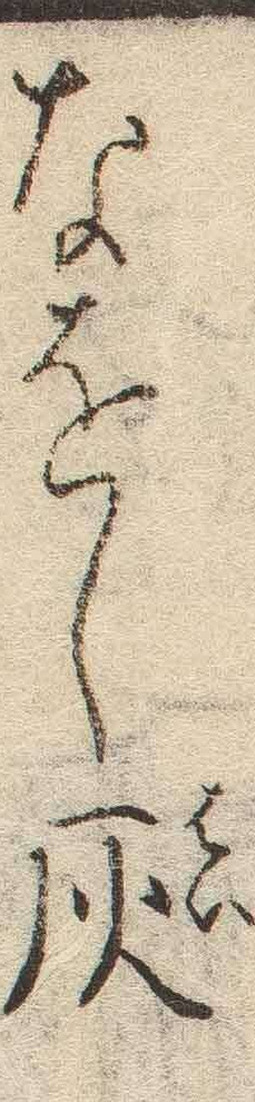なをし灰
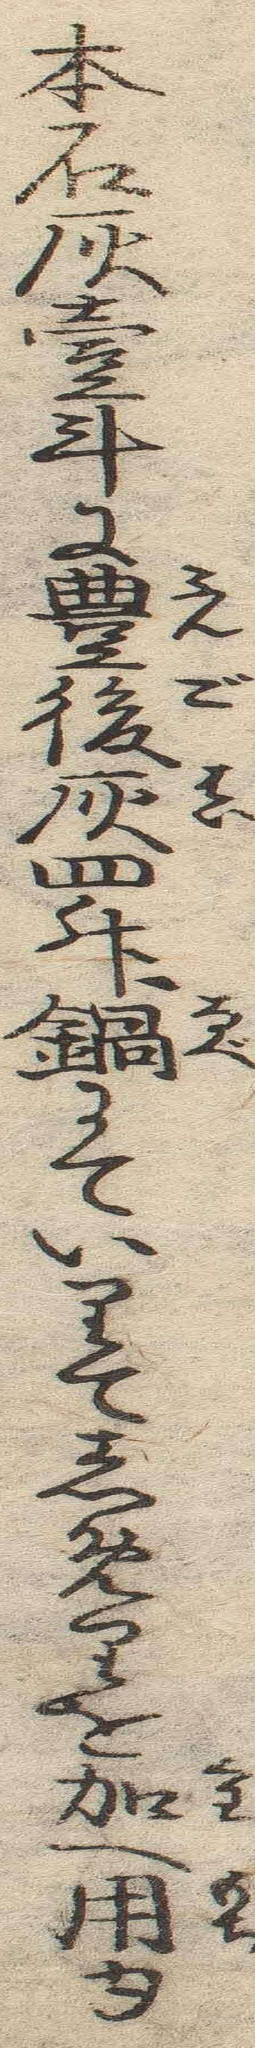本石灰壱斗に豊後灰四升。鍋にていりてしめりを加へ用ゆ
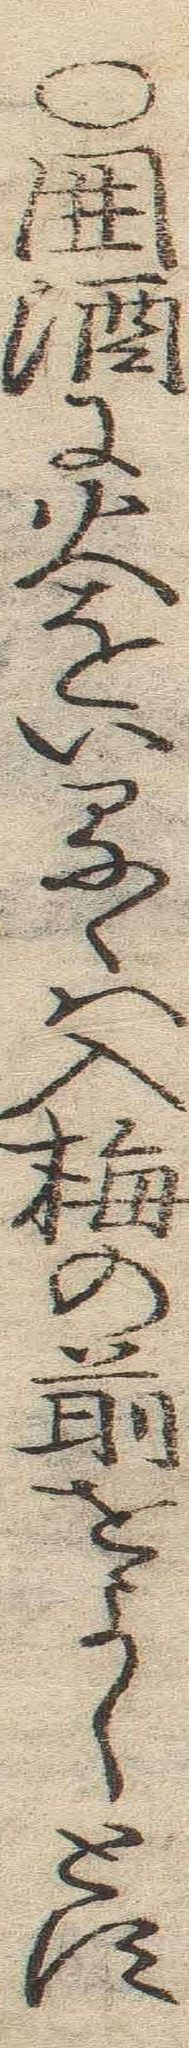○囲酒に火をいるゝは入梅の前をよしとす

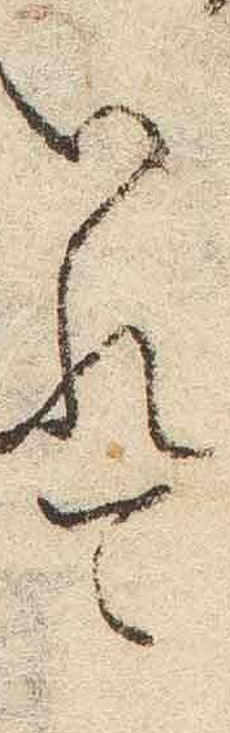いれて

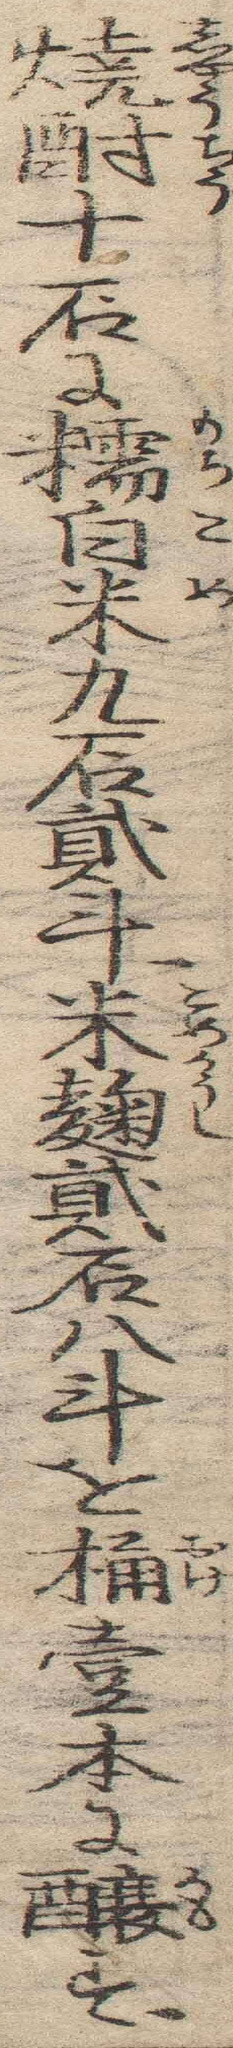焼酎十石に糯白米九石弐斗。米麹弐石八斗を桶壱本に醸す。
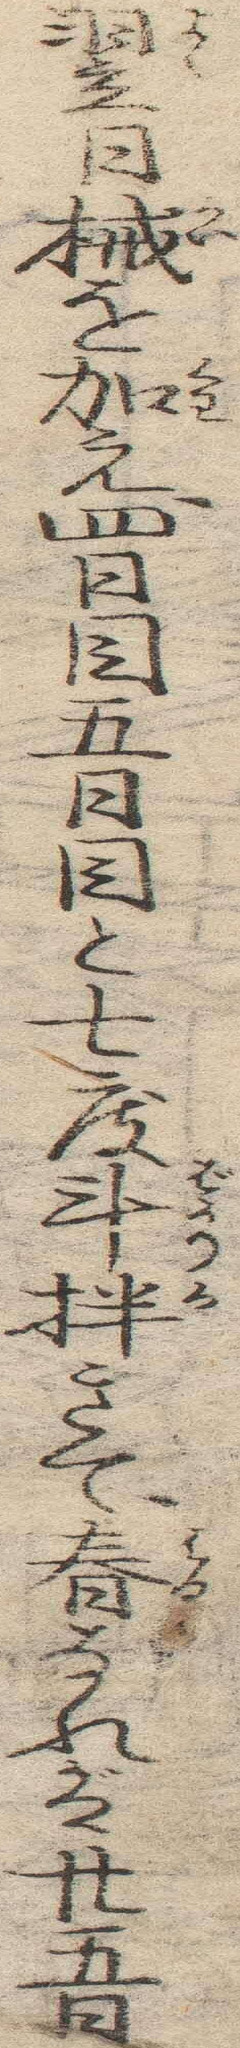翌日械を加え。四日目五日目と七度斗拌きて。春なれば廿五日
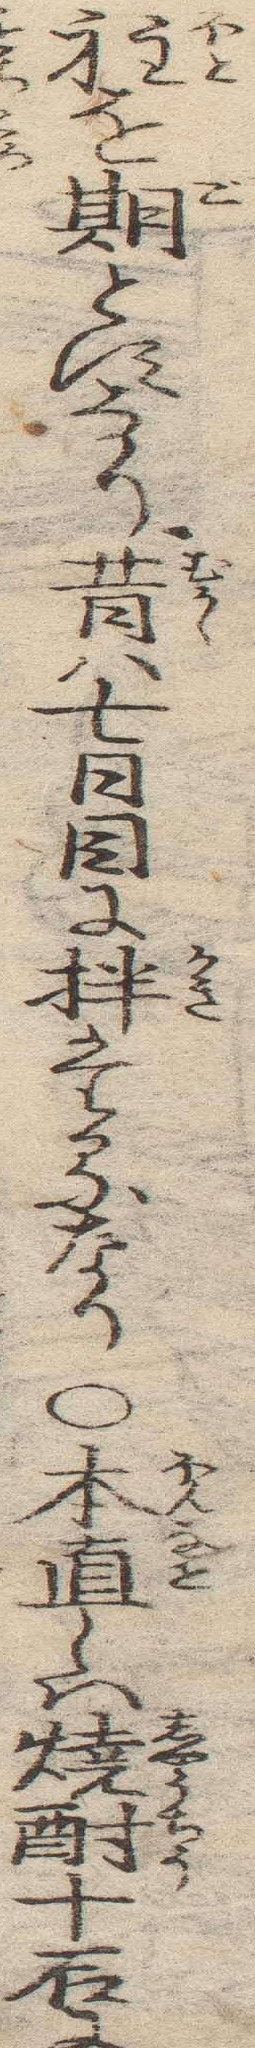程を期とすなり。昔は七日目に拌たるなり○本直しは焼酎十石に
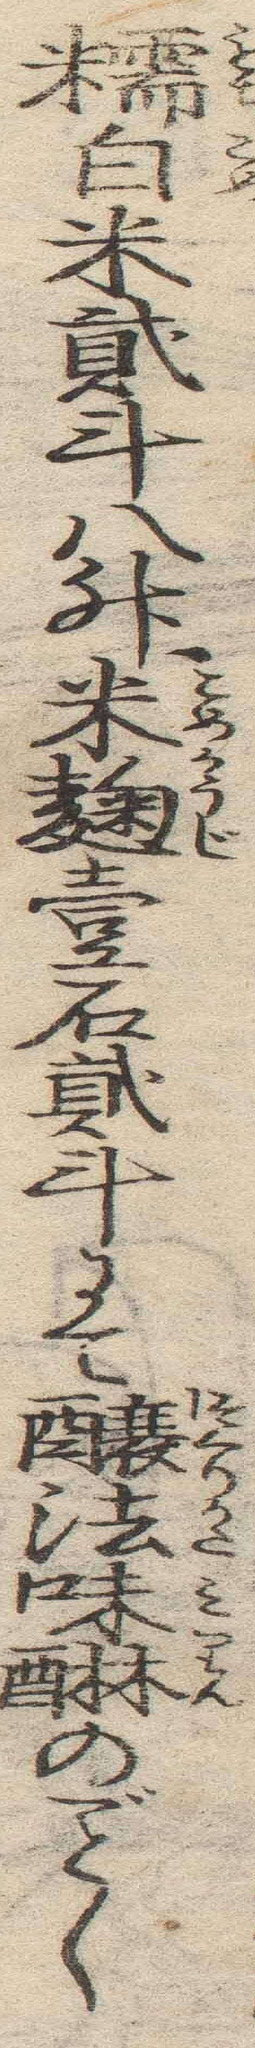糯白米弐斗八升。米麹壱石弐斗にて醸法味醂のごとし
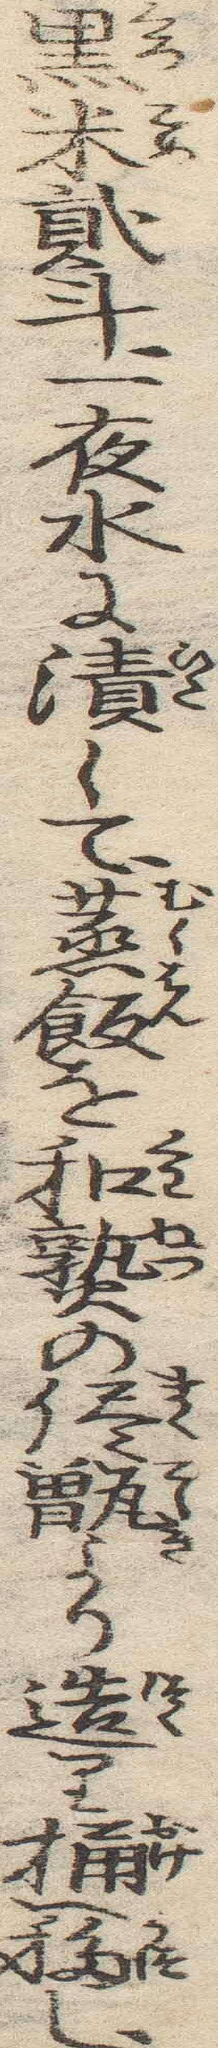黒米弐斗。一夜水に漬して。蒸飯を和熱の侭甑より造り桶へ移し。
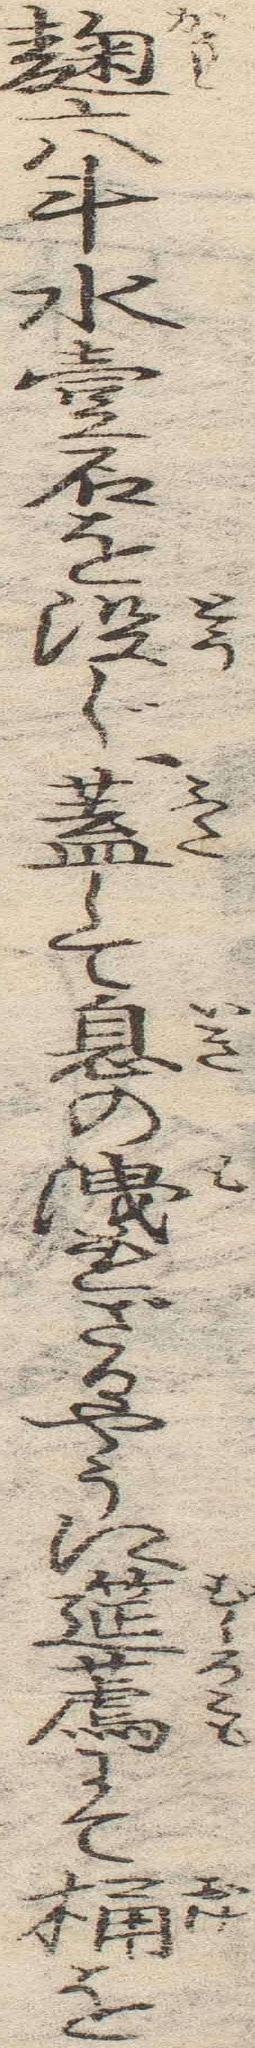麹六斗。水壱石を投じ。蓋して息の洩れざるやうに筵薦にて桶を
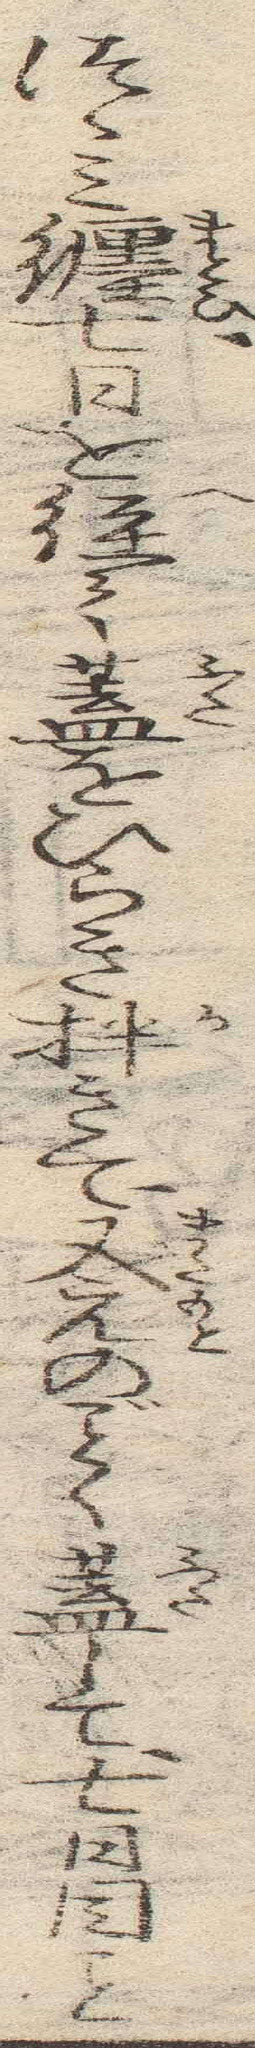つゝみ纏。七日を経て蓋をひらき拌きて。又元のごとく蓋して。七日目こと
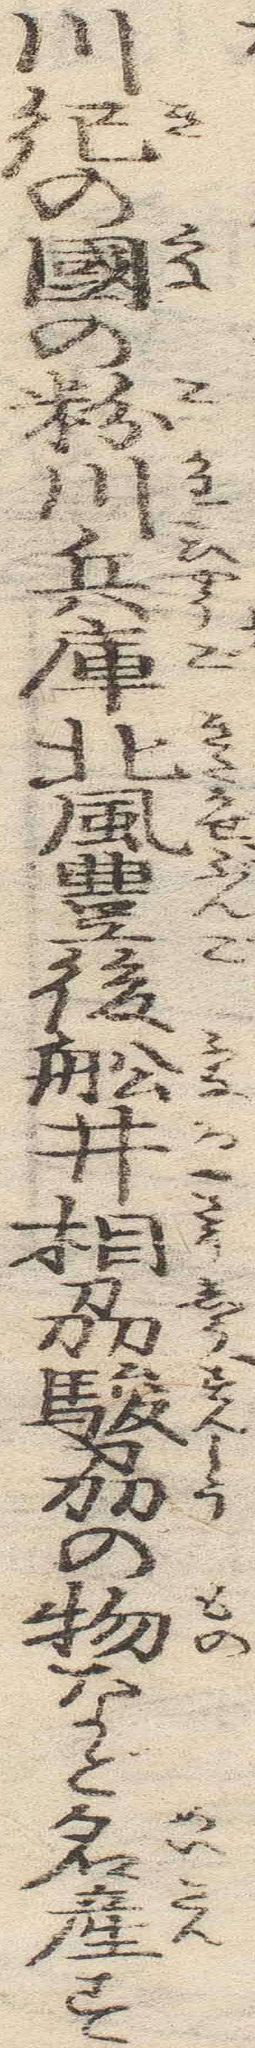川紀の国の粉川。兵庫北風。豊後船井。相州。駿州。の物など名産す
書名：日本山海名産図会
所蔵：東京学芸大学附属図書館 国文学研究資料館
